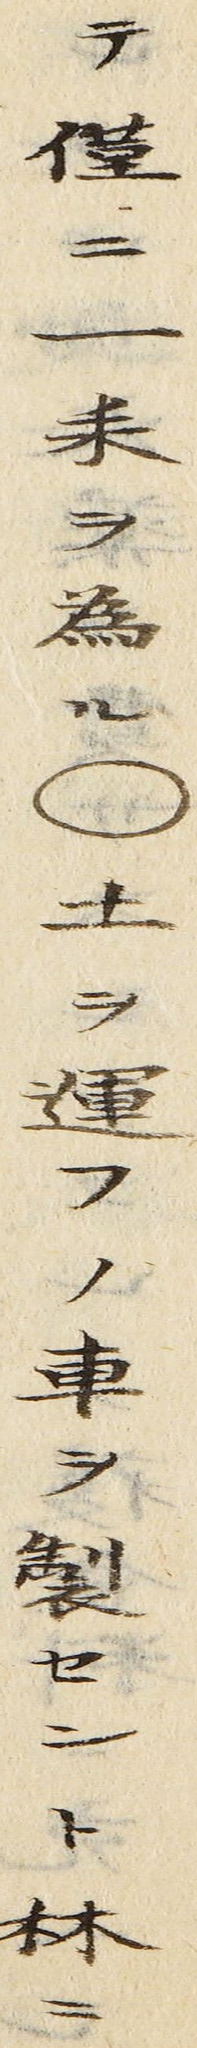テ僅ニ一耒ヲ為ル◯土ヲ運フノ車ヲ製セント林ニ
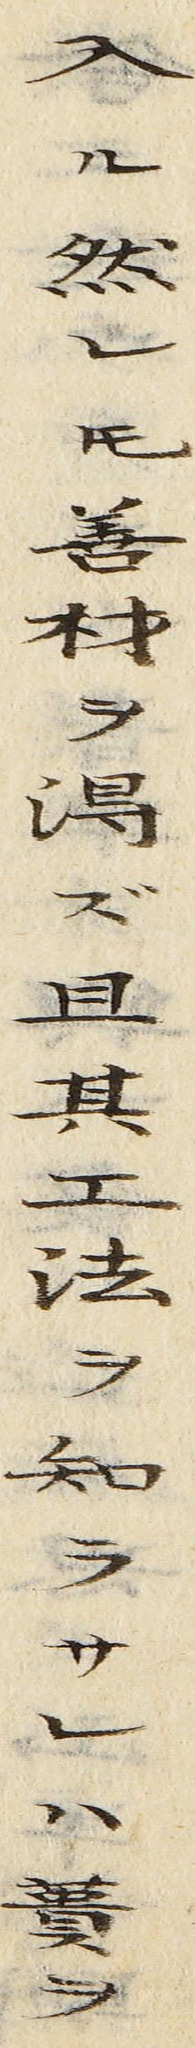入ル然レトモ善材ヲ得ズ且其工法ヲ知ラサレハ蕢ヲ
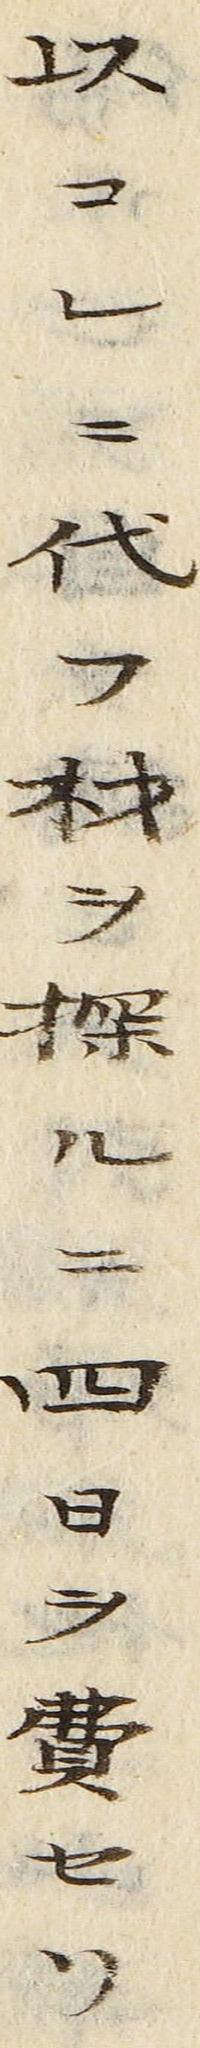以コレニ代フ材ヲ探ルニ四日費セリ
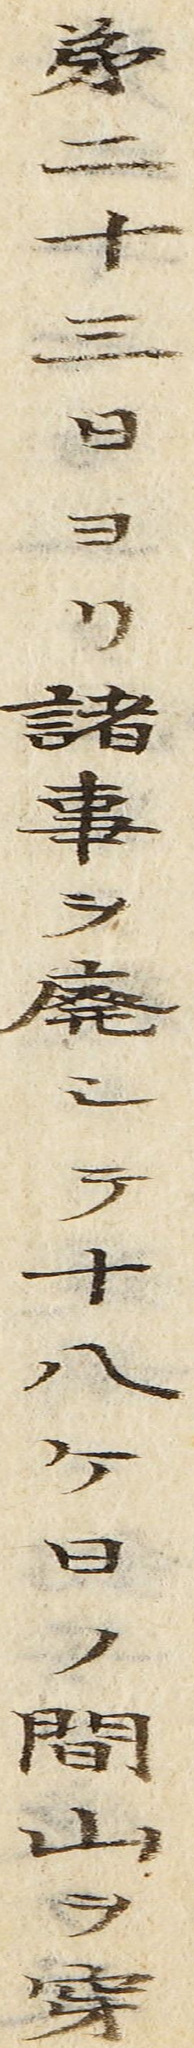第二十三日ヨリ諸事ヲ廃シテ十八ケ日ノ間山ヲ穿
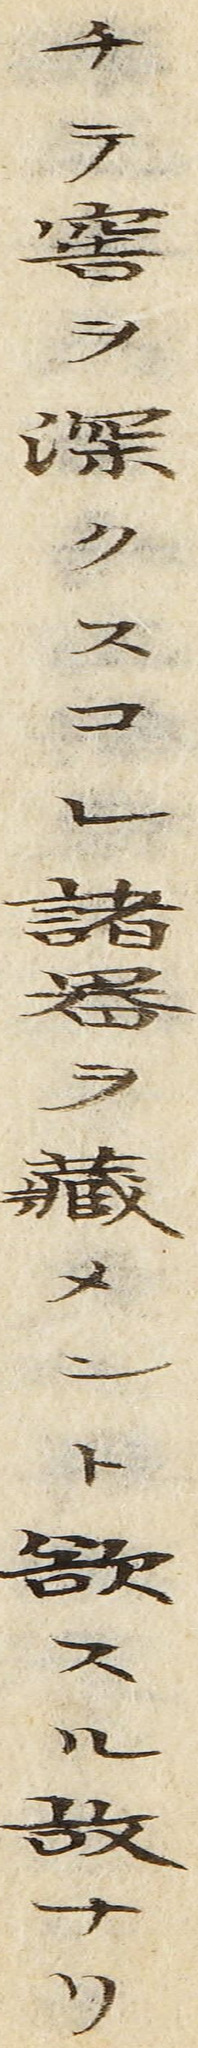チテ窖ヲ深クスコレ諸器ヲ蔵メント欲スル故ナリ
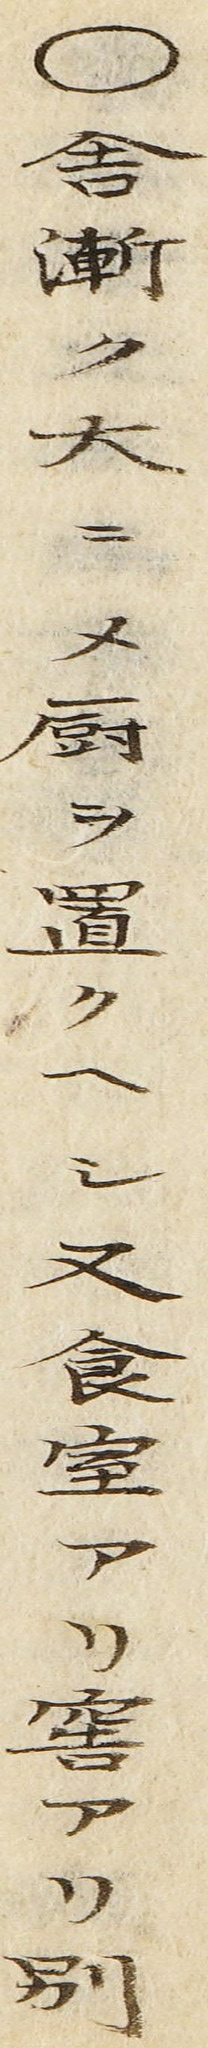◯舎漸ク大ニシテ厨ヲ置クヘシ又食室アリ窖アリ別
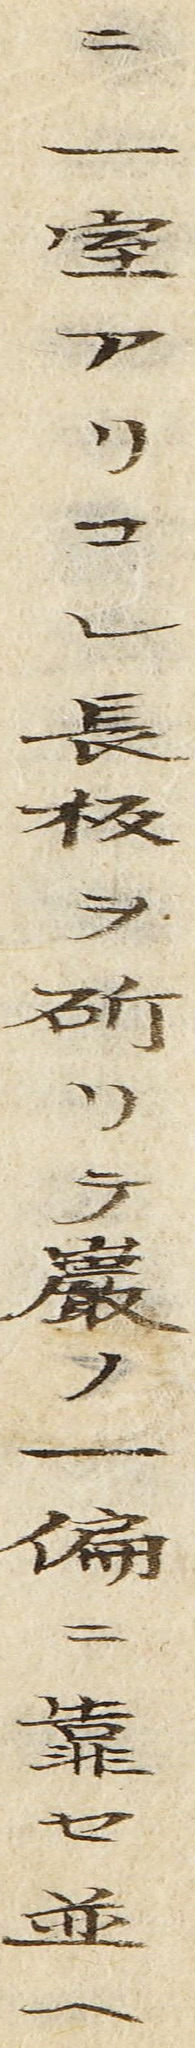ニ一室アリコレ長板ヲ斫リテ巌ノ一偏ニ靠セ並ヘ
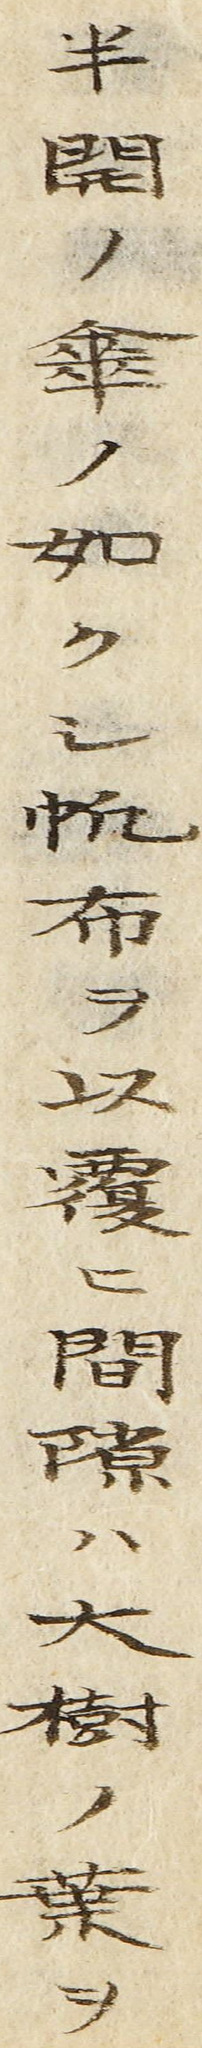半開ノ傘ノ如クシ帆布ヲ以覆ヒ間隙ハ大樹ノ葉ヲ
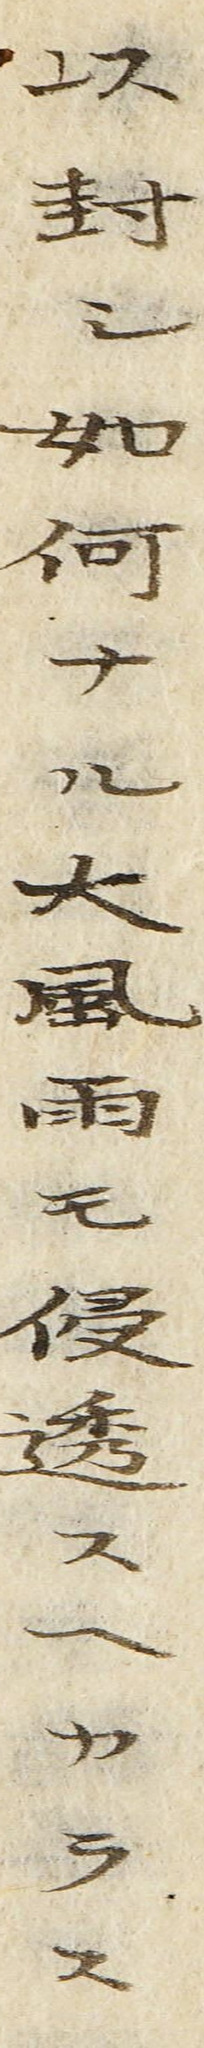以封シ如何ナル大風雨モ浸透スヘカラス
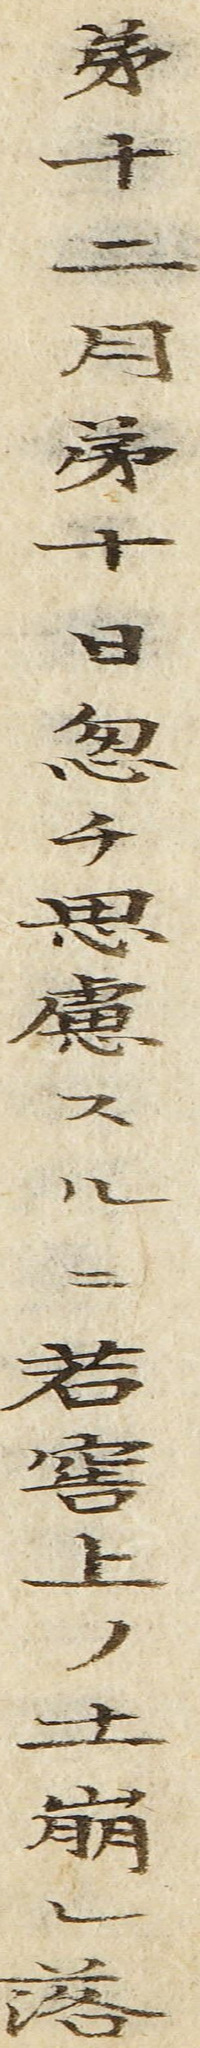第十二月第十日忽チ思慮スルニ若窖上ノ土崩レ落

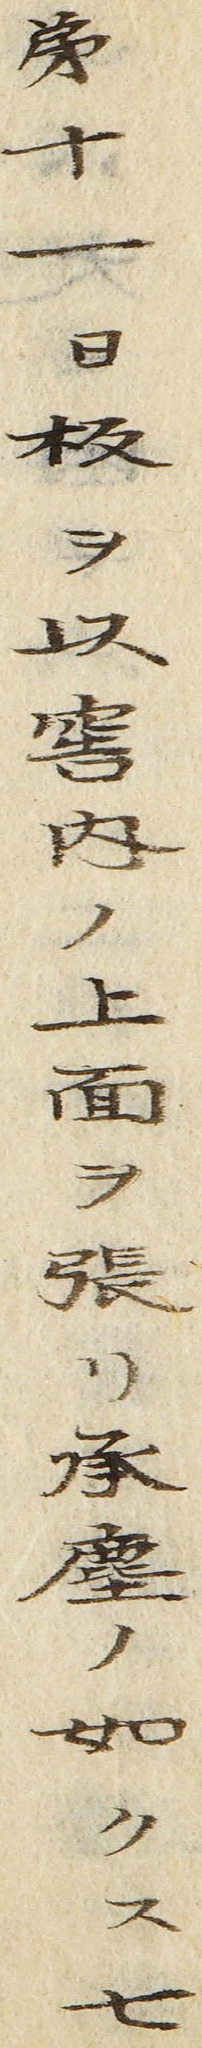第十一日板ヲ以窖内ノ上面ヲ張リ承塵ノ如クス七
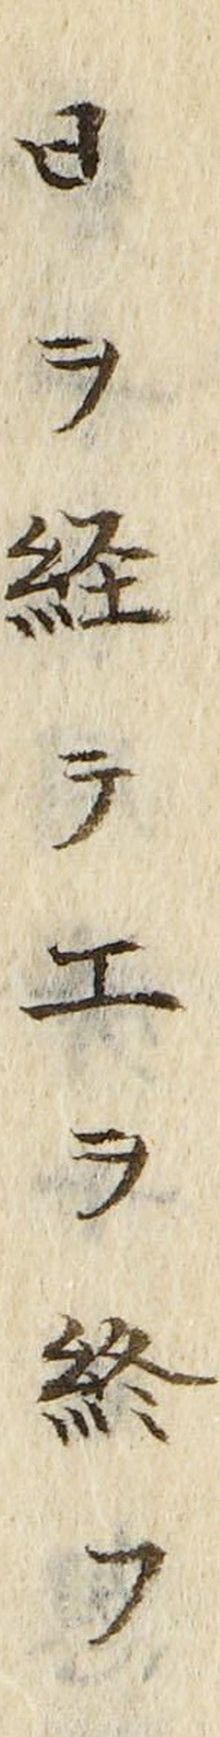日ヲ経テ工ヲ終フ
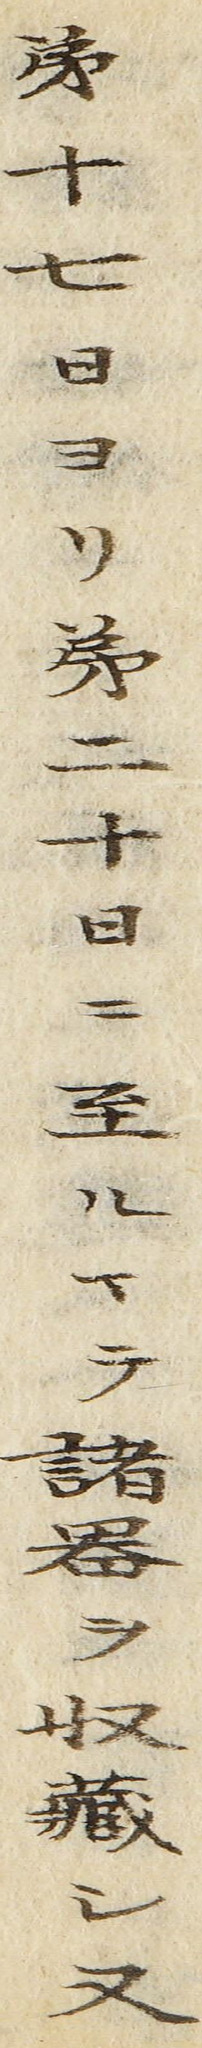第十七日ヨリ第二十日ニ至ルマテ諸器ヲ収蔵シ又
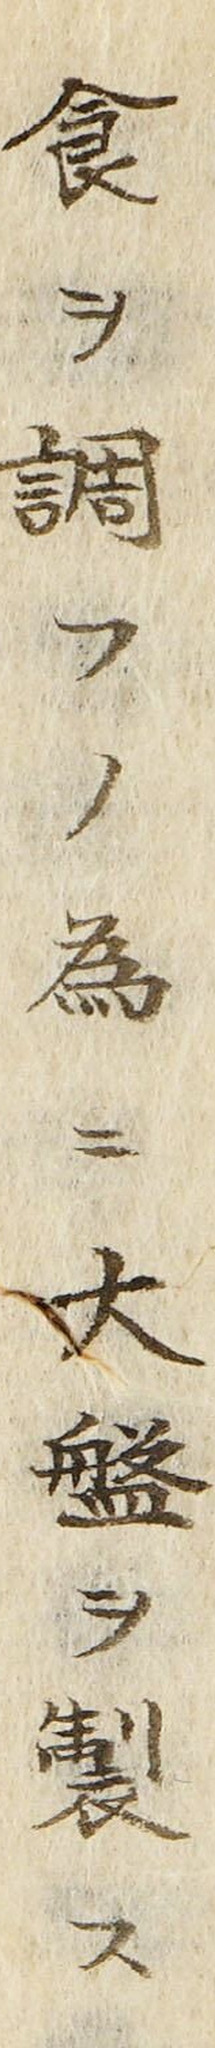食ヲ調フニ為ニ大盤ヲ製ス
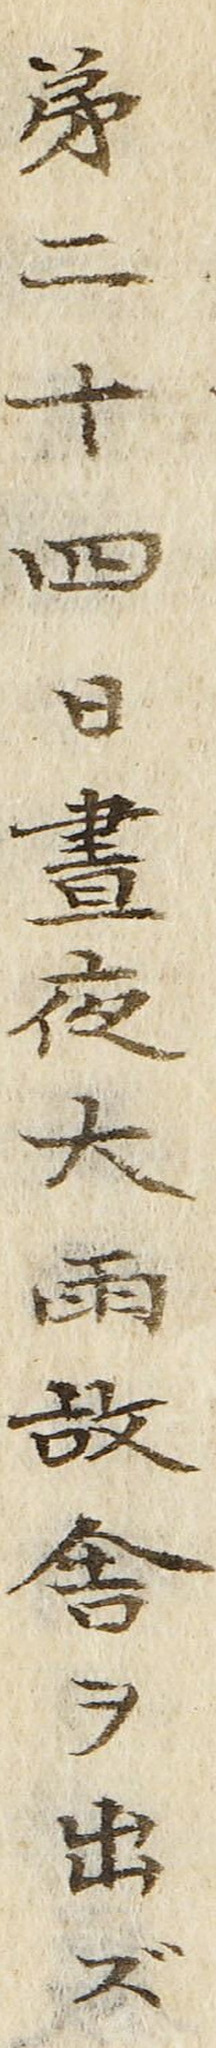第二十四日昼夜大雨故舎ヲ出ズ
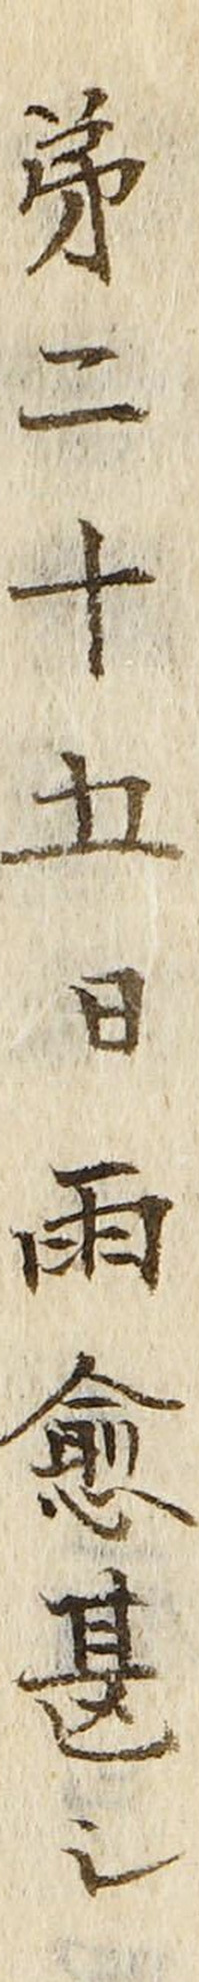第二十五日雨愈甚シ
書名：漂流紀事
